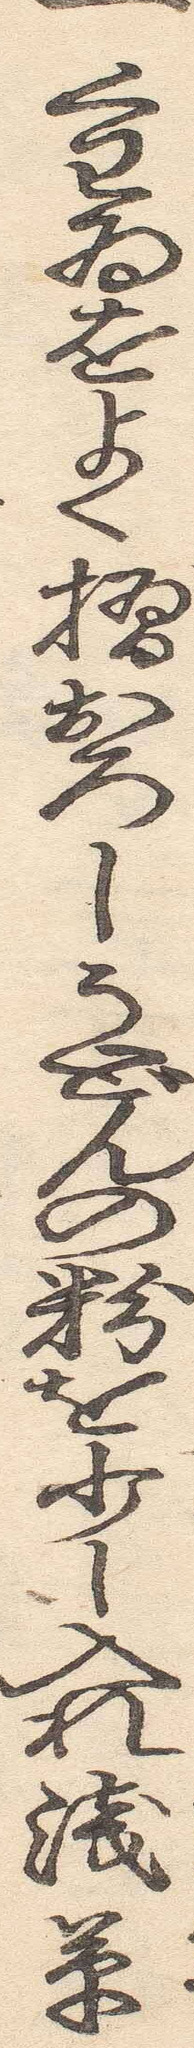一くわゐをよく摺おろしうどんの粉を少し入れ浅草
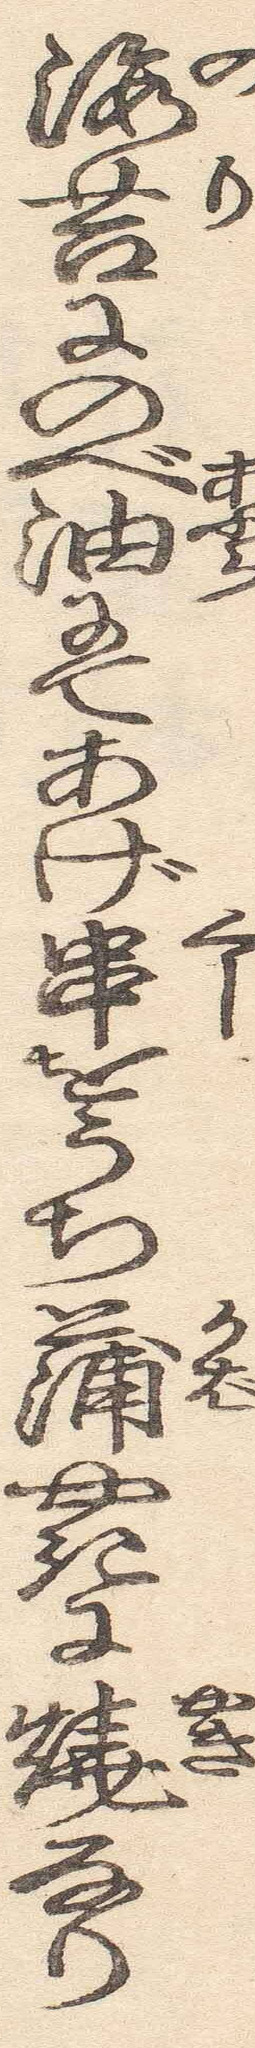海苔にのべ油にてあげ串をうち蒲やきに焼なり
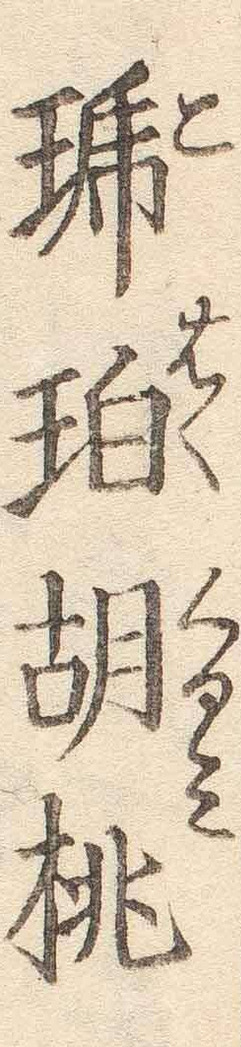琥珀胡桃
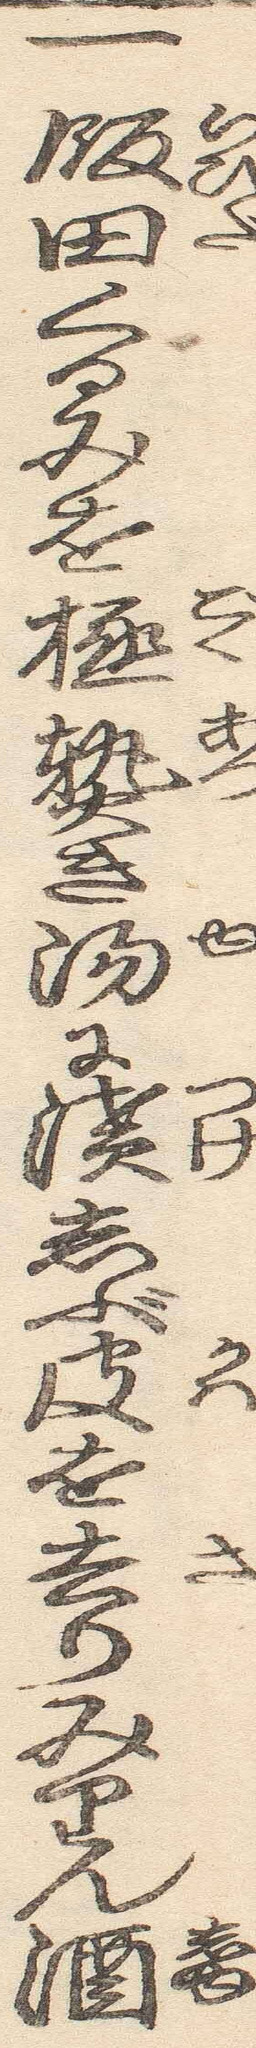一飯田くるみを極熱き湯に漬しぶ皮を去りみりん酒
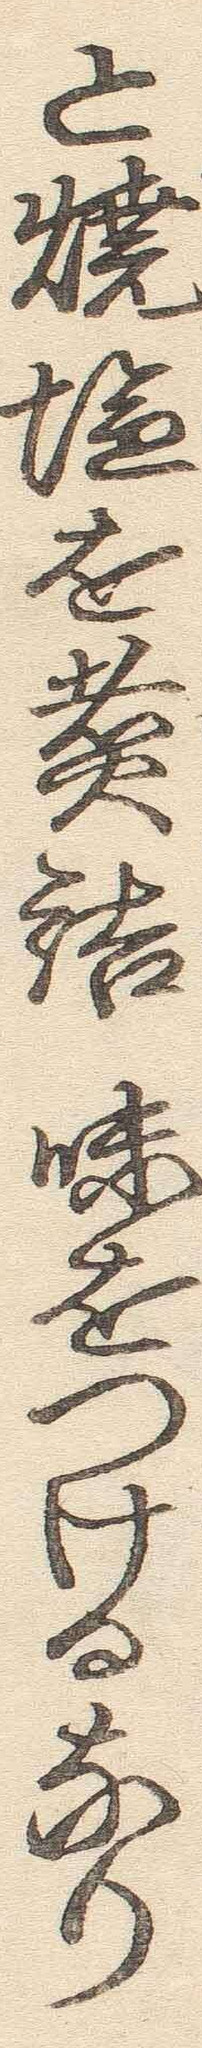と焼塩を煮詰味をつけるなり
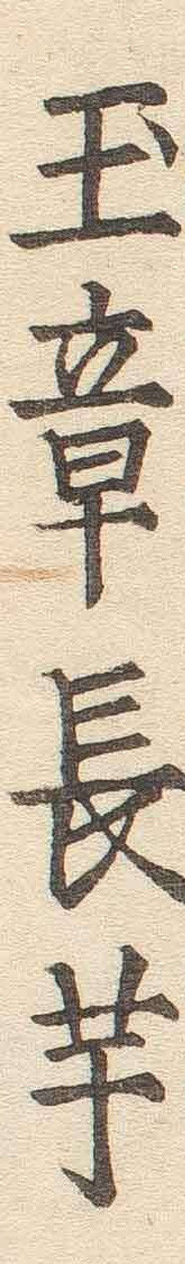玉章長芋
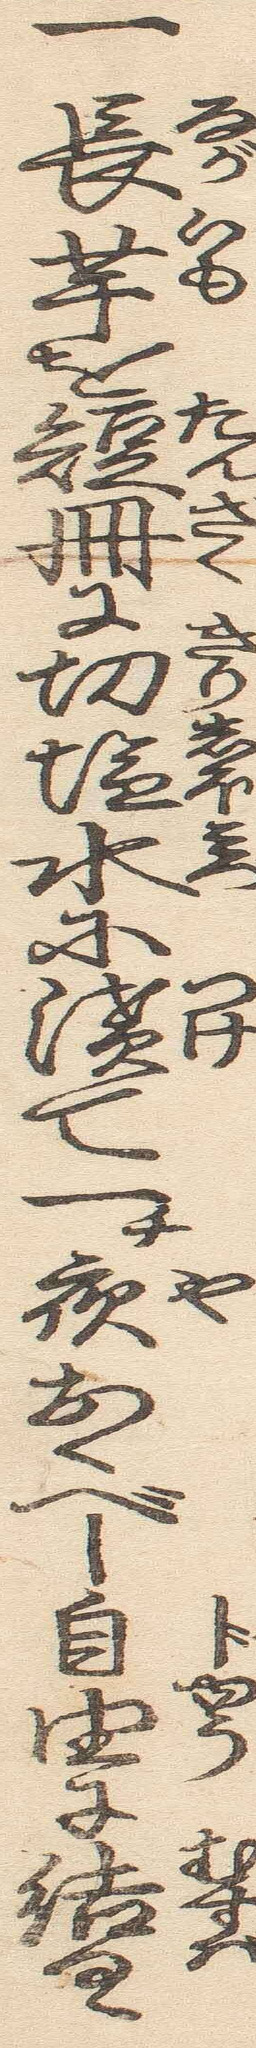一長芋を短冊に切塩水に漬て一夜おくべし自由に結るゝ
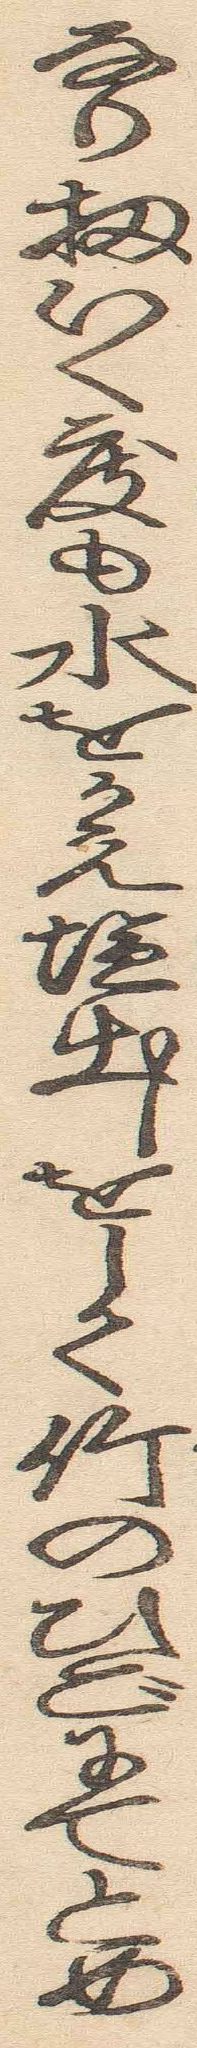なり扨いく度も水をかえ塩出しをして竹のひごにてとめ

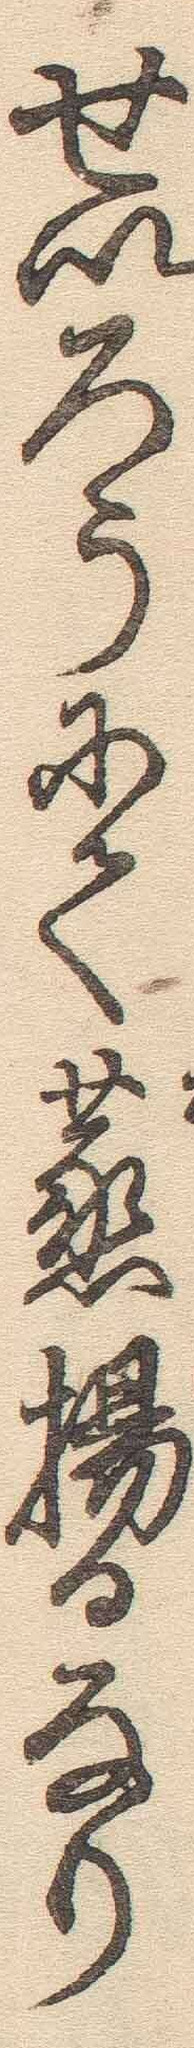せいろうにて蒸揚るなり
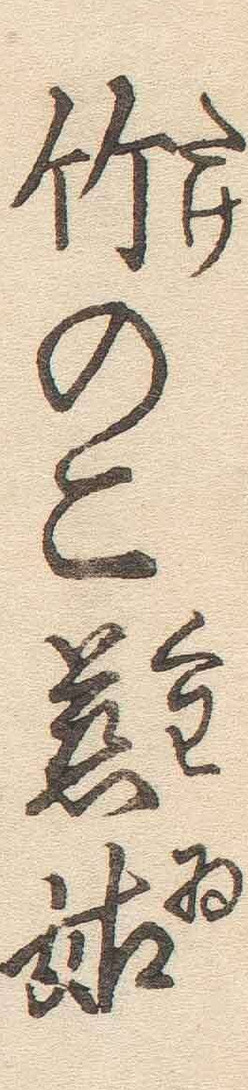竹のこ慈姑
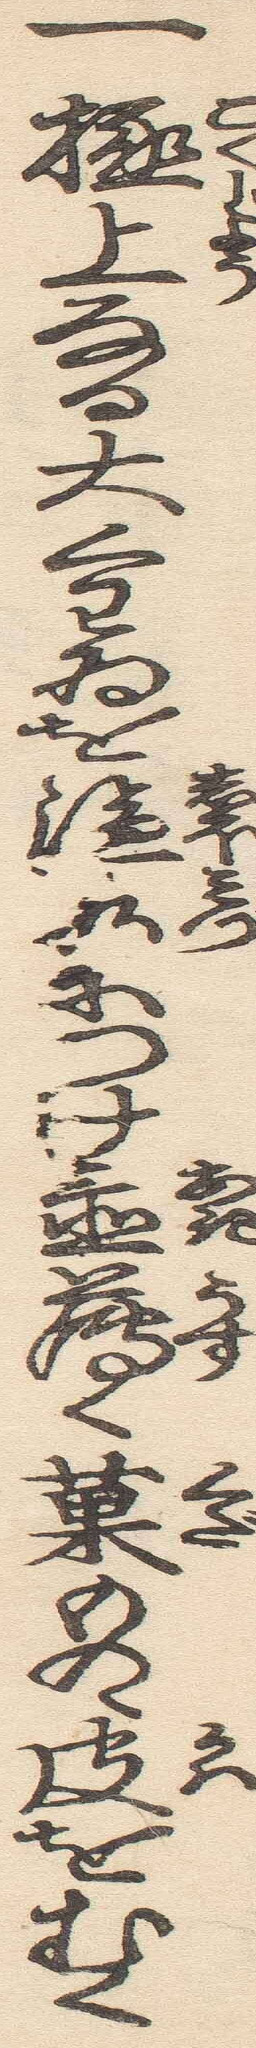一極上なる大くわゐを塩水につけ置薄く菓ものヽ皮をむく
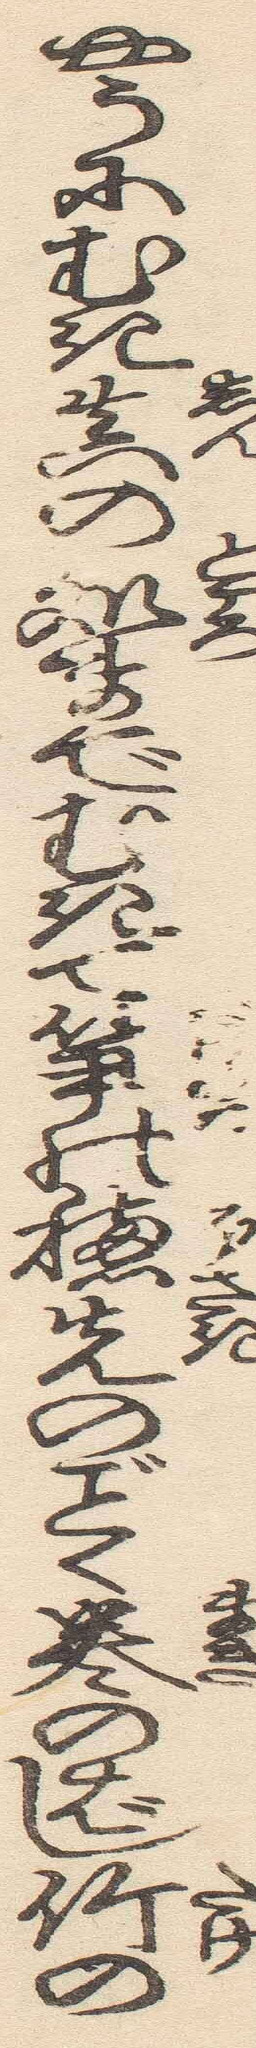やうにむき芯の処までむきで笋の穂先のごとく巻のばし竹の
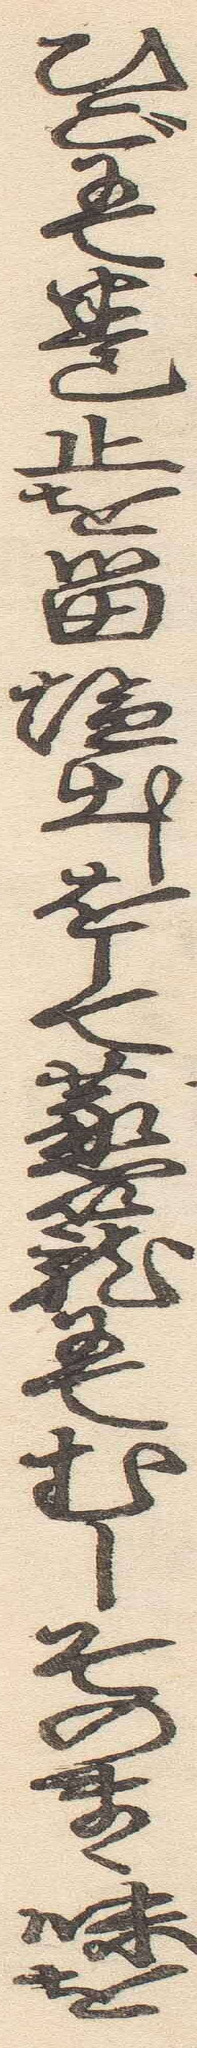ひごにて巻止を留塩出しをして蒸籠にてむしそのまゝ味を
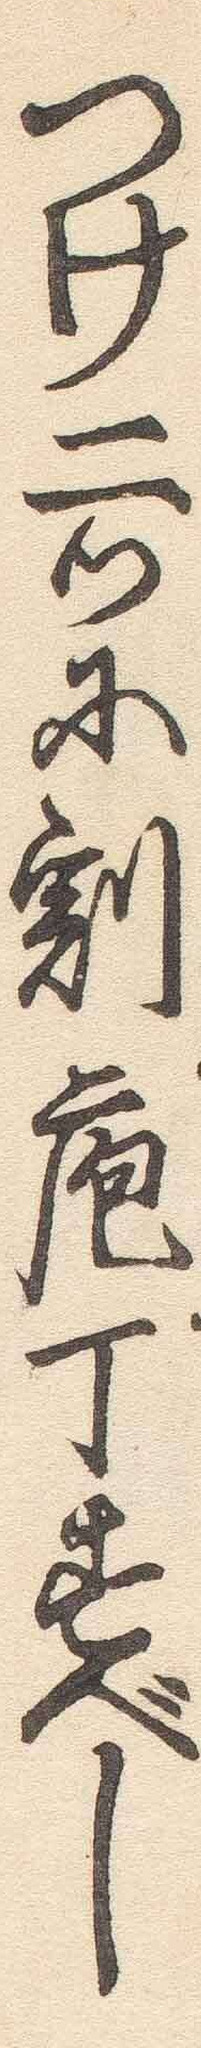つけ二つに割庖丁すべし
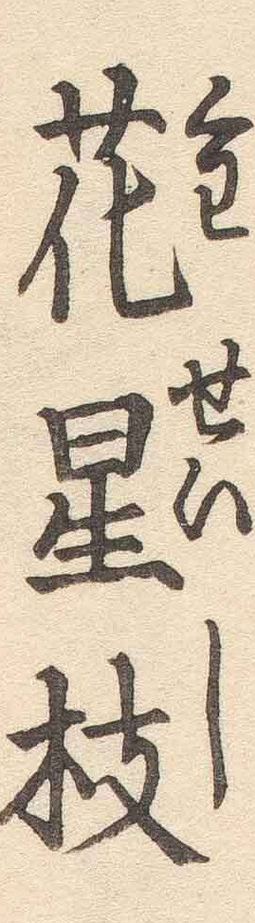花星枝
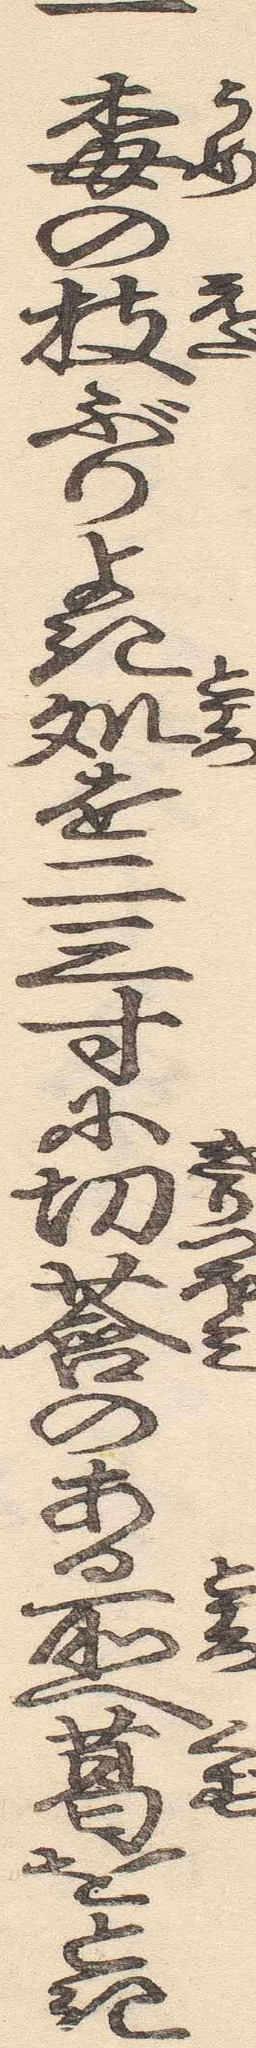一梅の枝ぶりとき処を二三寸に切莟のある所へ葛をとき
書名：料理通
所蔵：東京学芸大学附属図書館 国文学研究資料館
